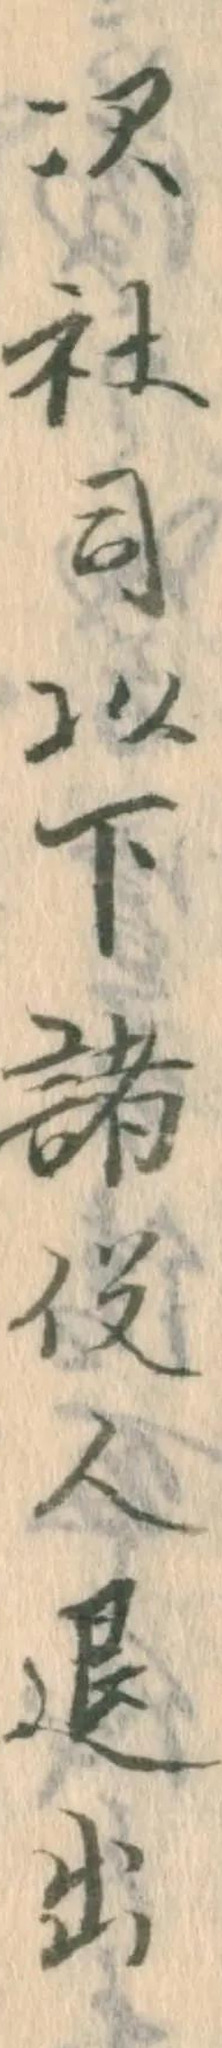次社司以下諸役人退出
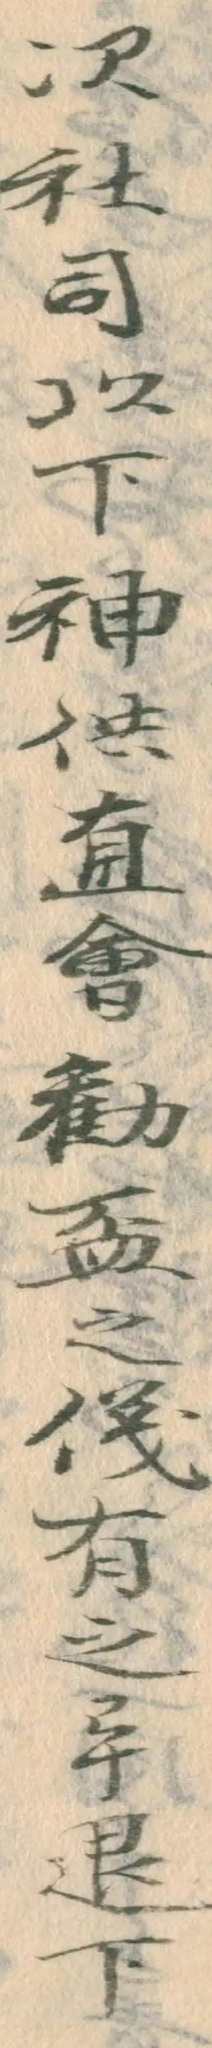次社司以下神供直会勧盃之儀有之畢退下
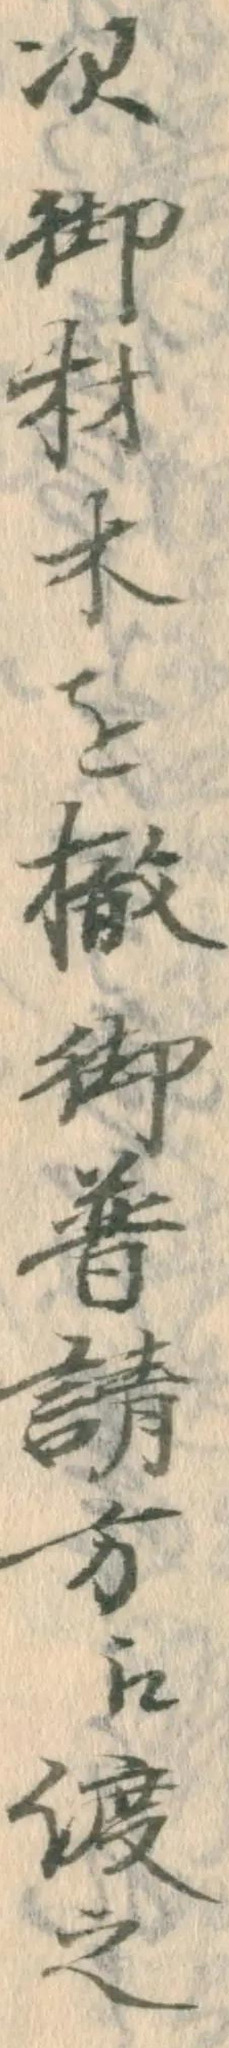次御材木を撤御普請方江渡之
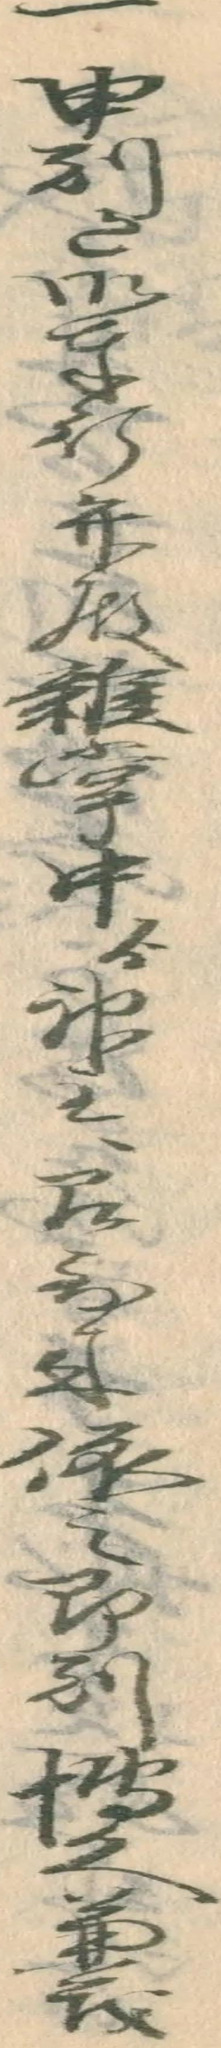一申刻過御奉行弁殿雑掌中ゟ神主へ召到来依之即刻博久兼茂
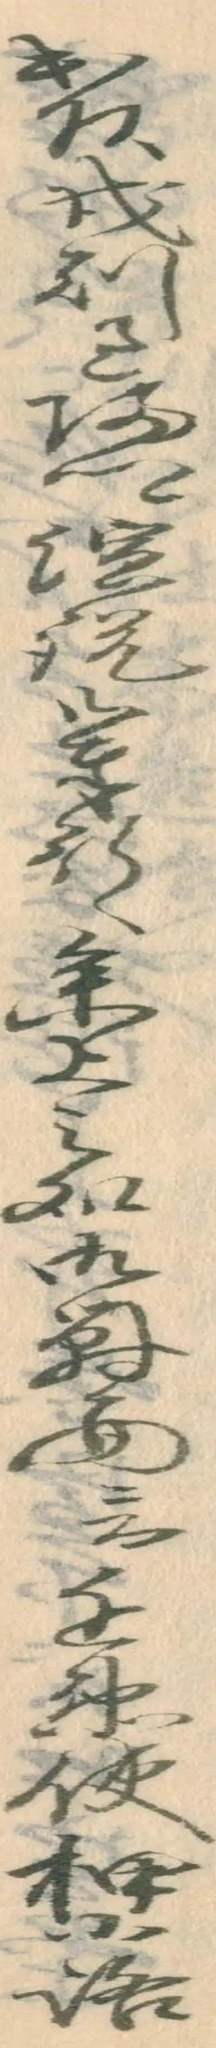出頭戌刻過帰郷演説御奉行へ参上之処御対面ニ而近衛使押小路

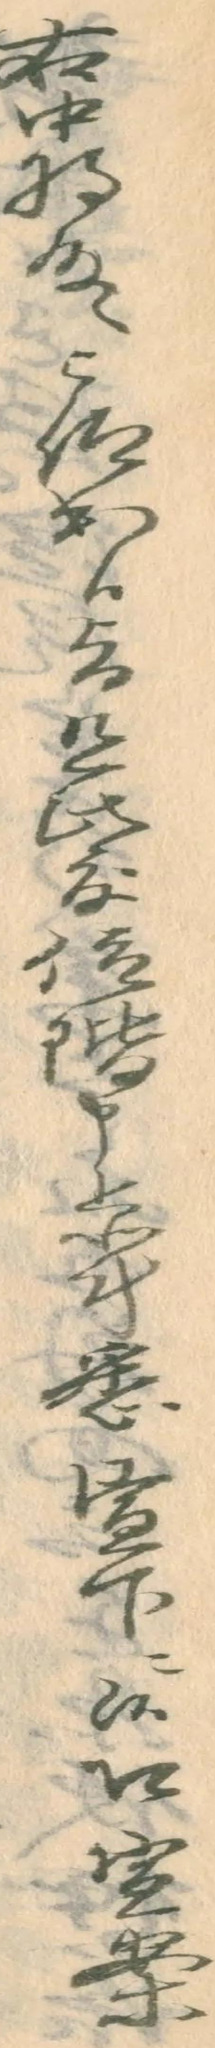右中将殿へ被仰出候旨且此度位階申上輩悉宣下ニ候口宣案
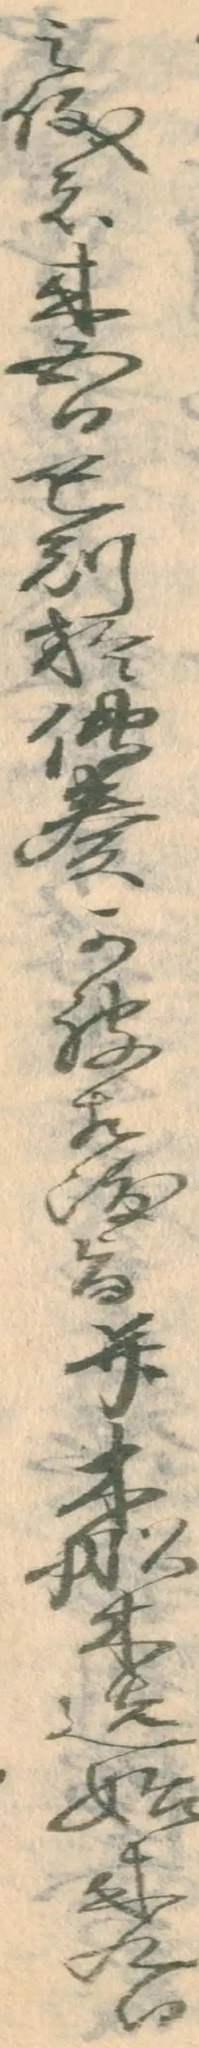之儀は来五日巳刻於伝奏可被相渡旨并木船木造始来九日
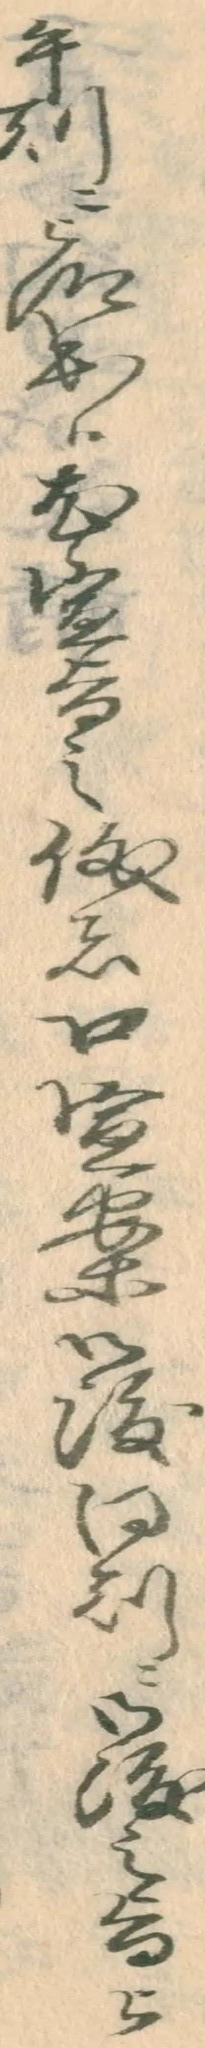午刻ニ被仰出候尤宣旨之儀は口宣案御渡同刻ニ御渡之旨被
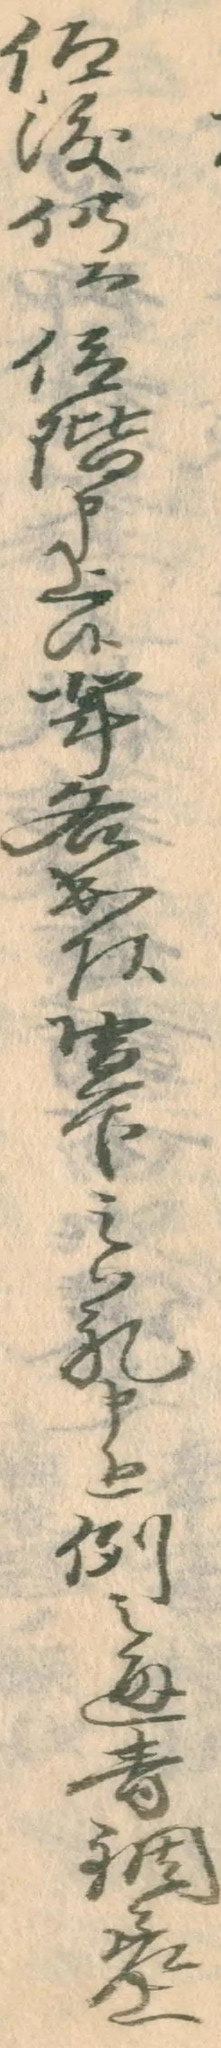仰渡仍而位階申上候輩各出頭宣下之御礼申上例之通青銅差上
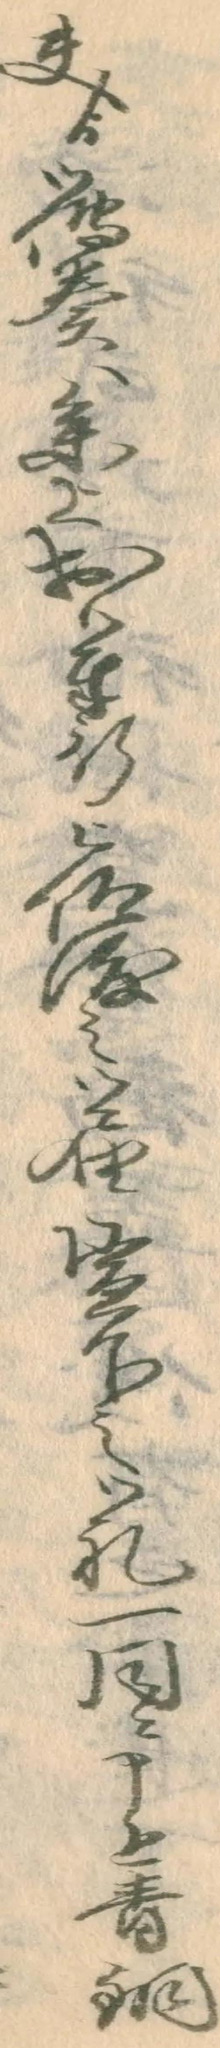夫ゟ御伝奏へ参上於御奉行被仰渡之御届宣下之御礼一同ニ申上青銅
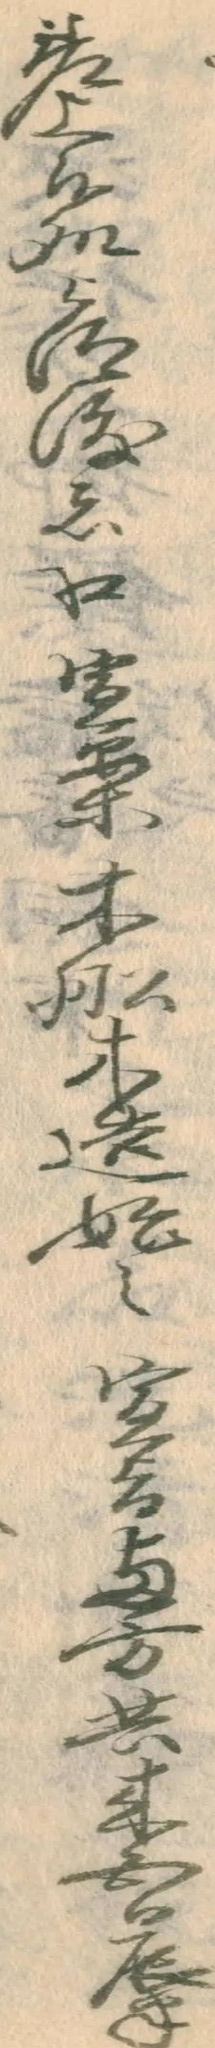差上候処被仰渡は口宣案木船木造始之宣旨両方共来五日辰半
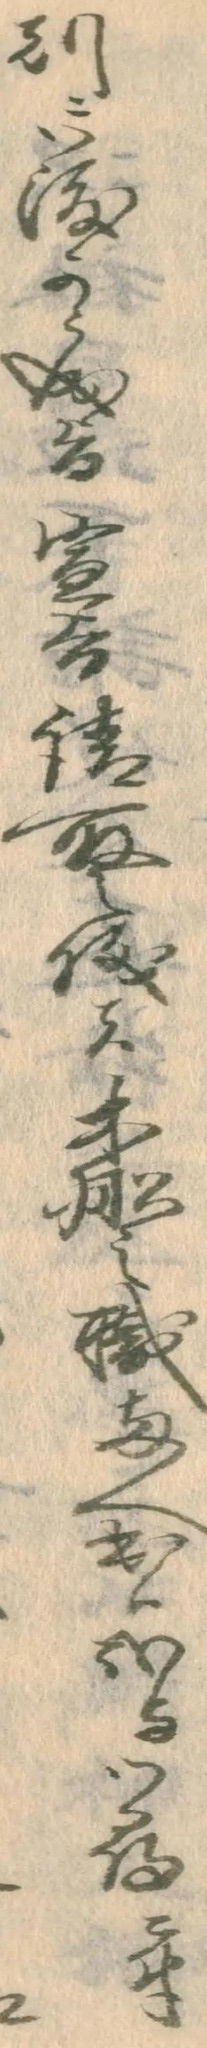刻ニ御渡可被成旨宣旨請取之儀は木船之職両人出候哉与御尋ニ付
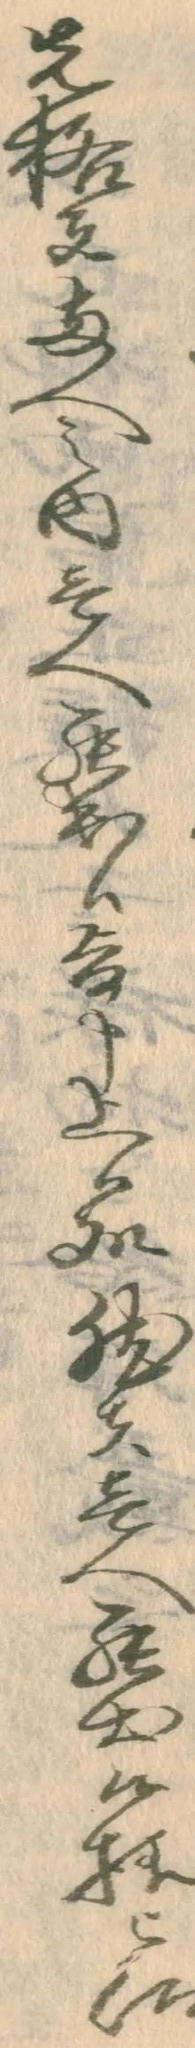先格は両人之内壱人罷出候旨申上候処然者壱人罷出候様被仰
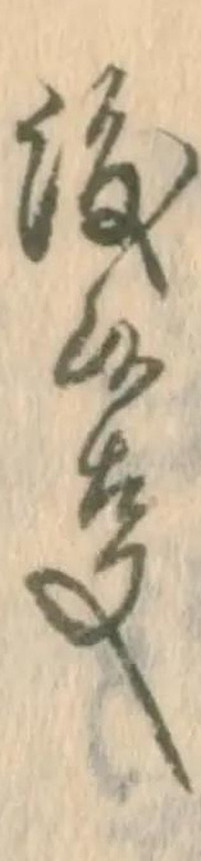渡候事
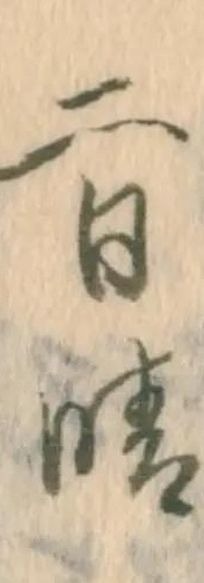二日晴
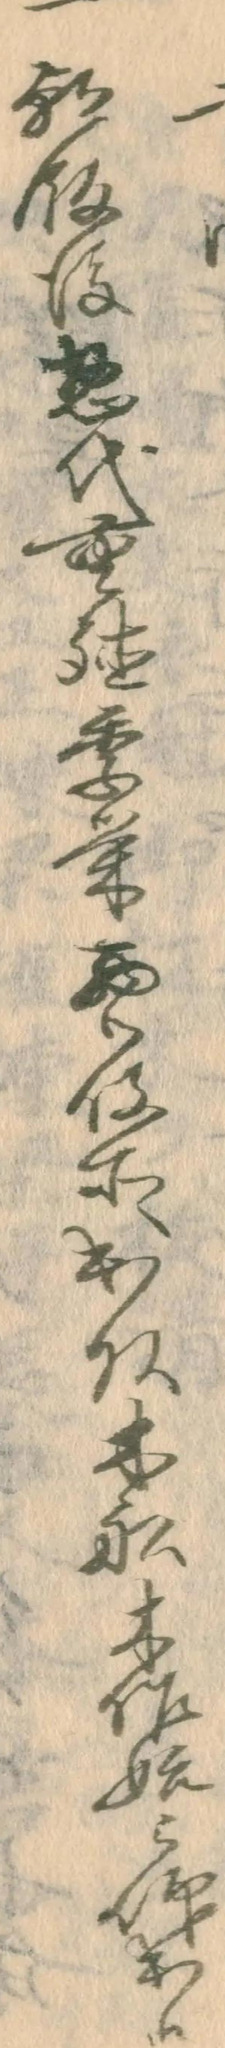一朝飯後惣代重殖季栄西御役所へ出頭木船木作始被仰出候
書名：賀茂社記録. 第17冊
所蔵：国立国会図書館 National Diet Library, JAPAN
